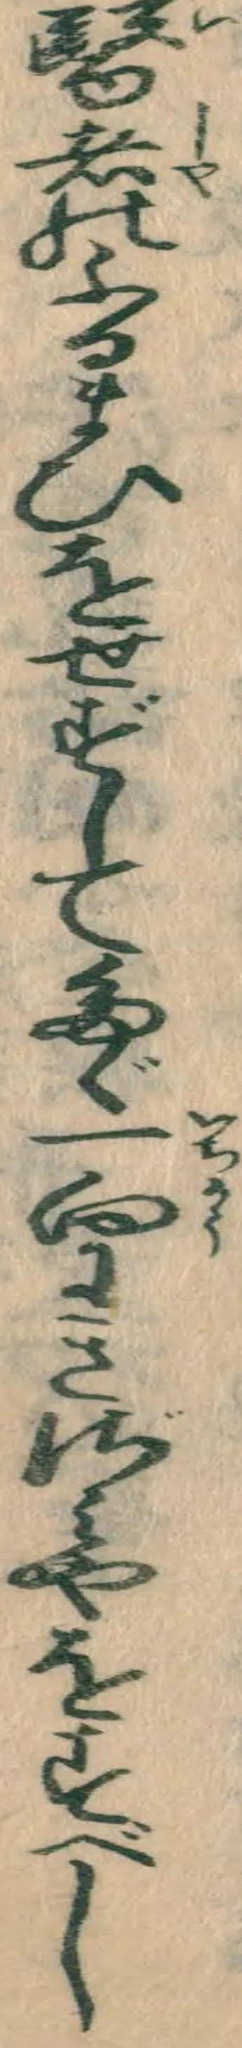医者のふるまひをせずしてたゞ一向にきざみやをすべし

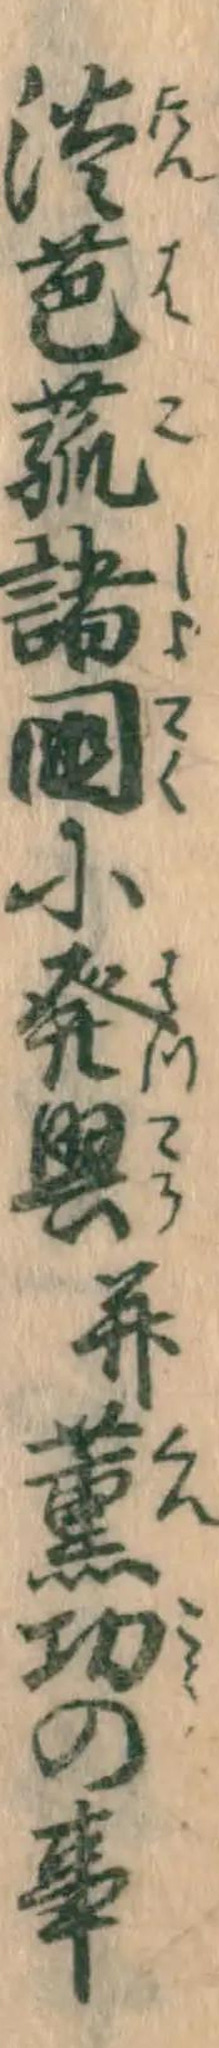淡芭菰諸国に発興并薫功の事
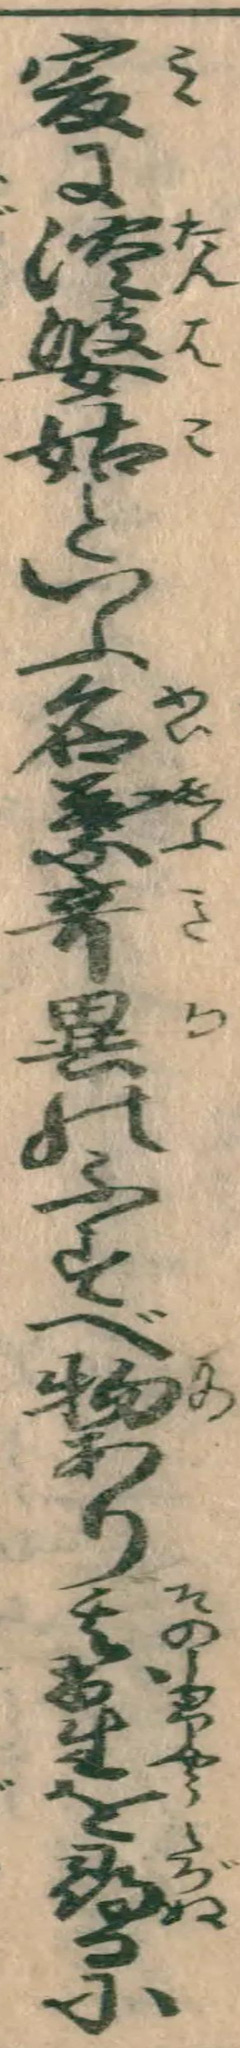爰に淡婆姑といふ名葉奇異のふすべ物あり其出生を尋るに
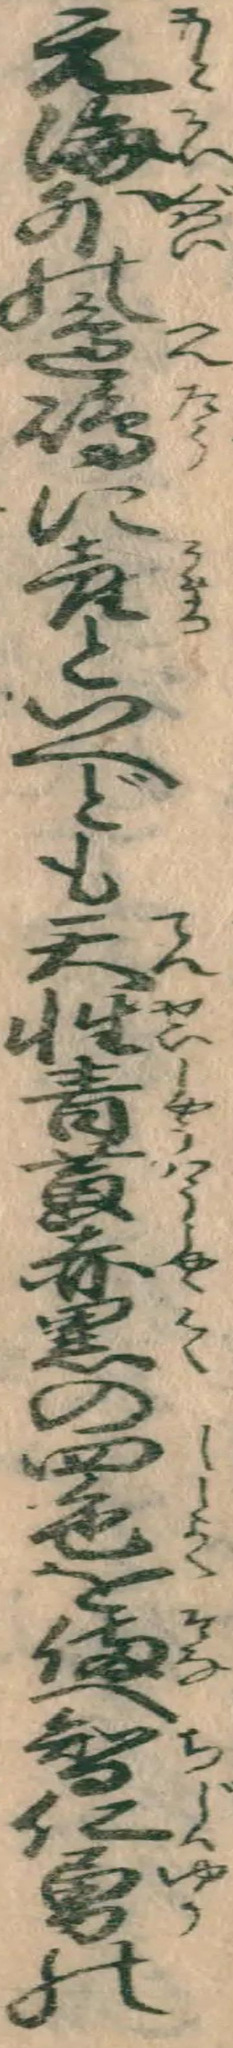元海外の辺島に産といへども天性青黄赤黒の四色を備へ智仁勇の
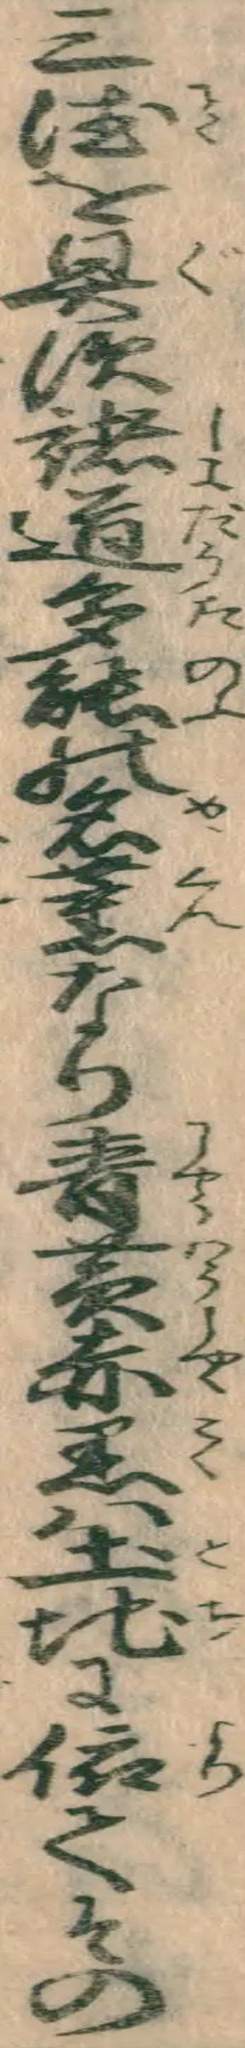三徳を具す諸道多能の名薫なり青黄赤黒は土地に依てその
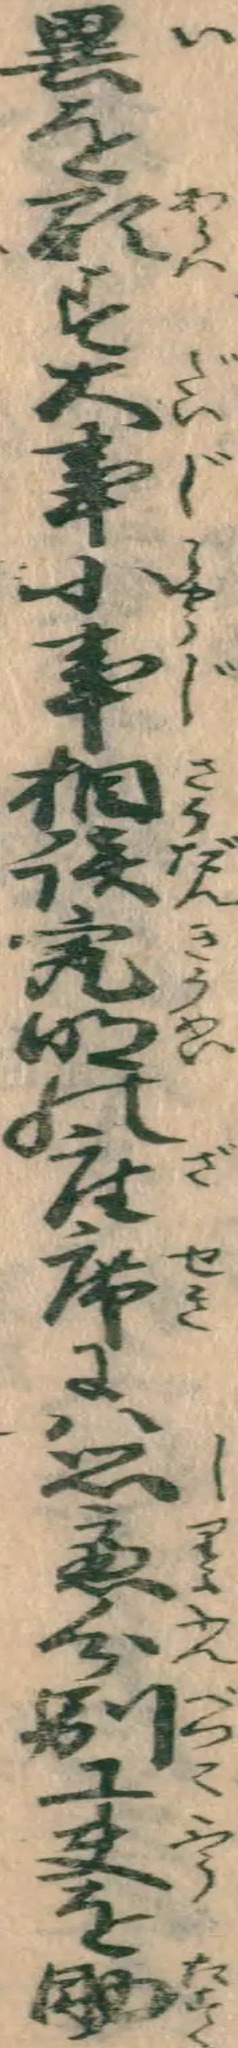異を顕す大事小事相談究明の座席には思慮分別工夫を助
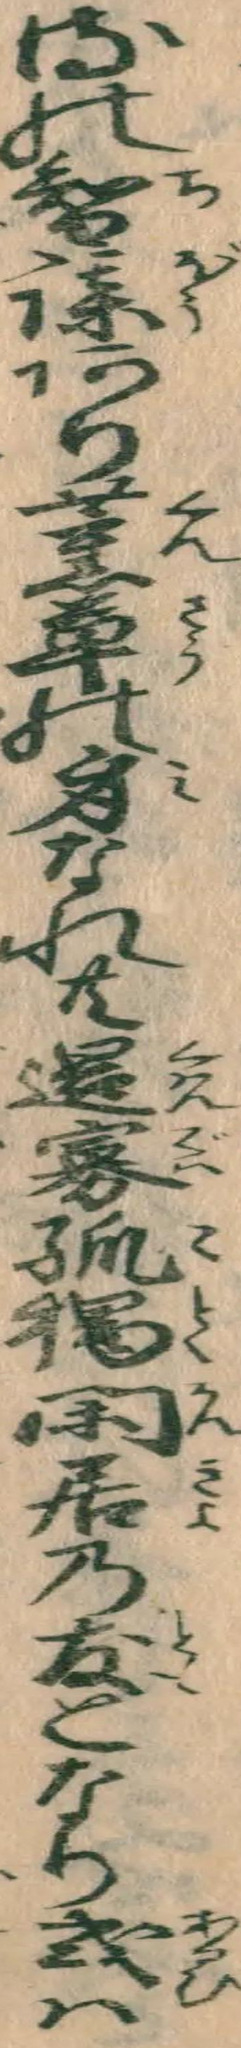るの智謀あり薫草の身なれ共還寡孤独閑居の友となり或は
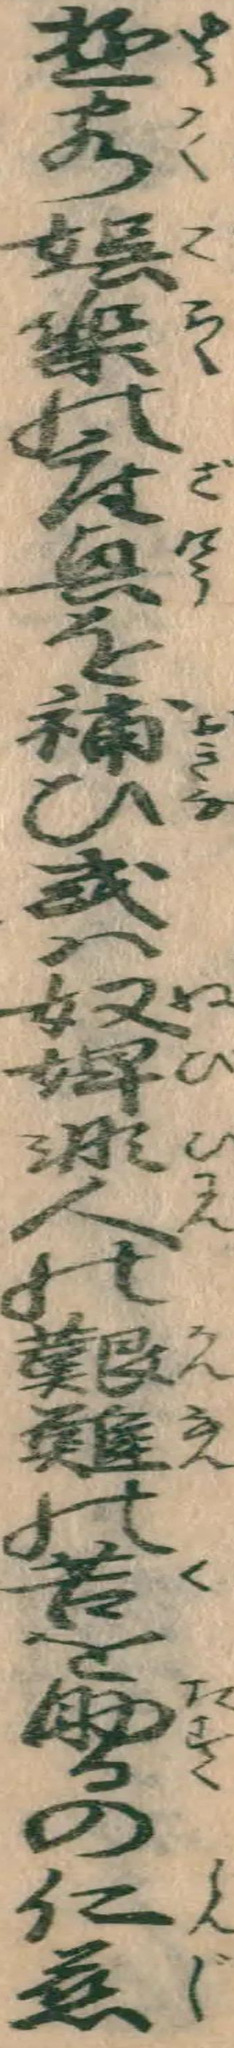遊客娯楽の座興を補ひ或は奴婢非人の艱難の苦を助るの仁慈
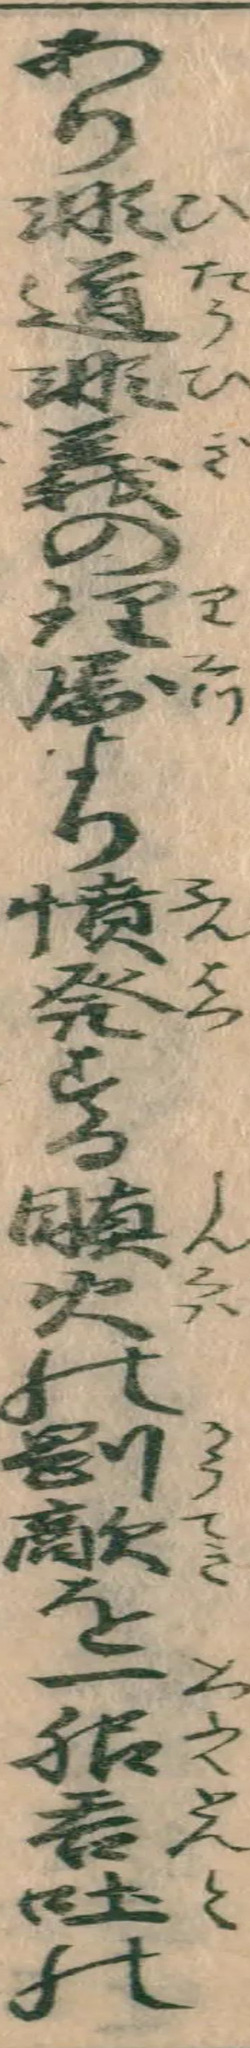あり非道非義の理屈より憤発する瞋火の剛敵を一服呑吐の
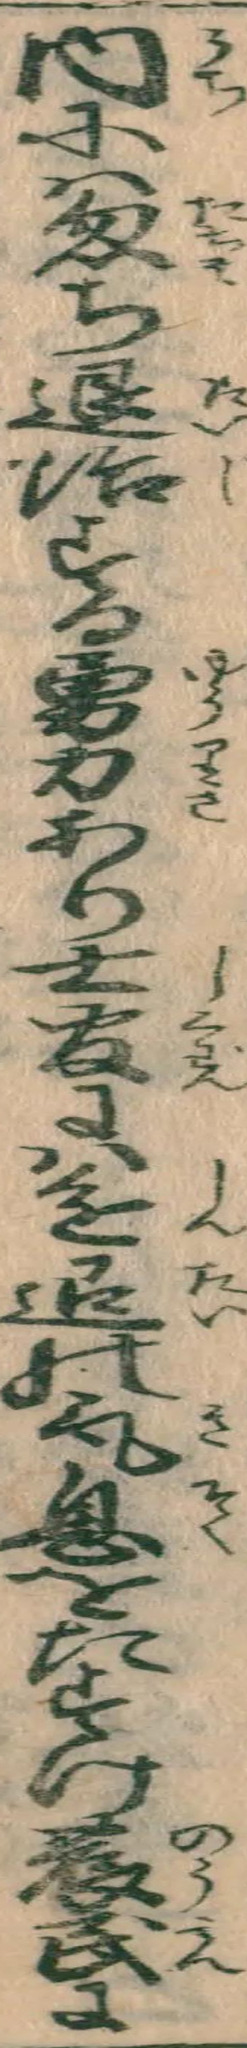内には忽ち退治する勇力あり士官には進退の気息をたすけ農民に
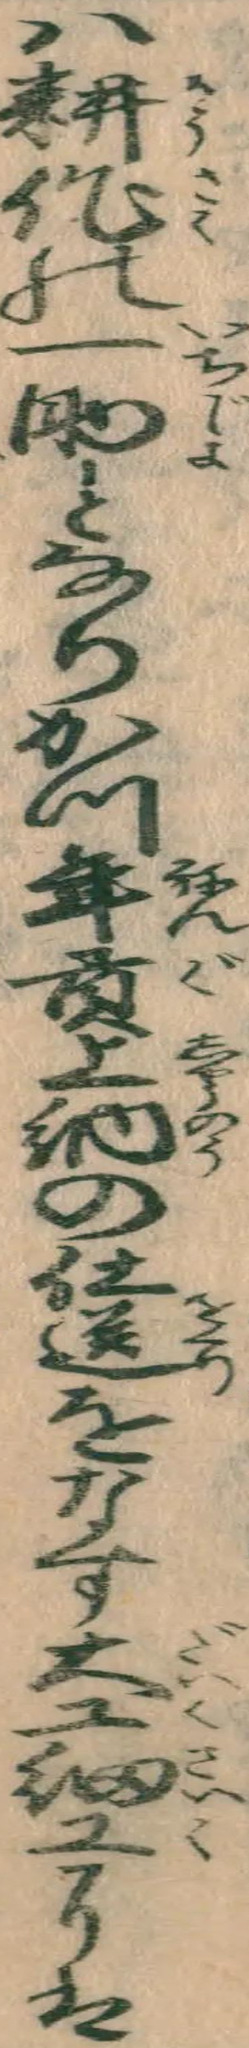は耕作の一助となりかつ年貢上納の仕送をなす大工細工には
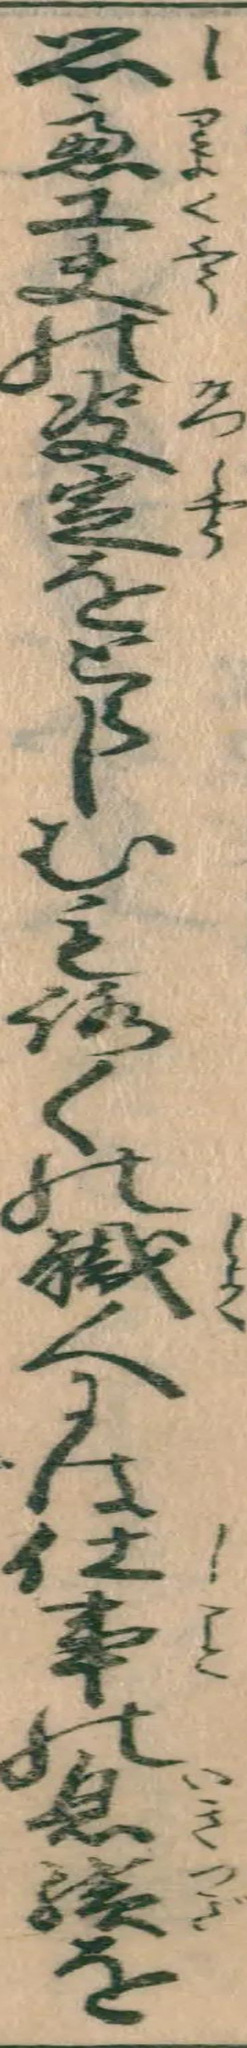思慮工夫の決定をとらしむもろ〳〵の職人には仕事の息継を
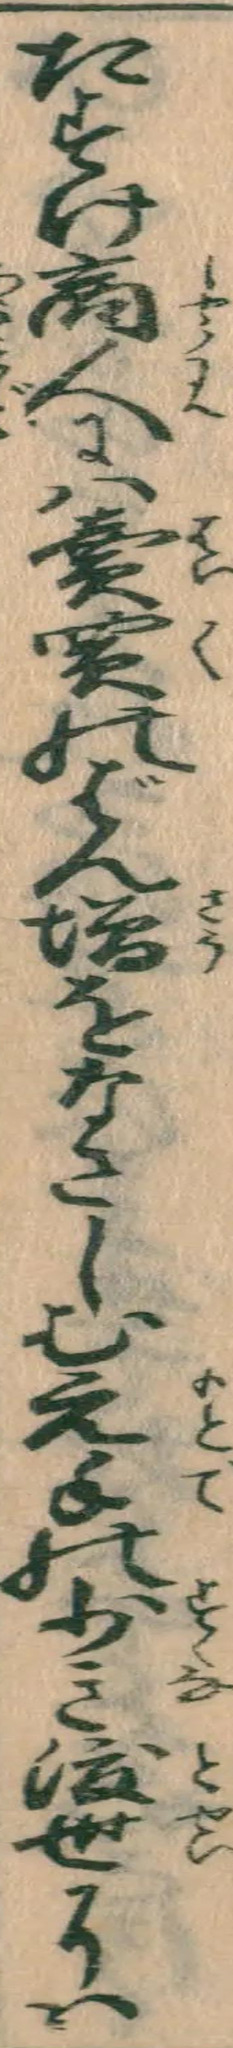たすけ商人には売買のばん増をなさしむ元手の少き渡世には
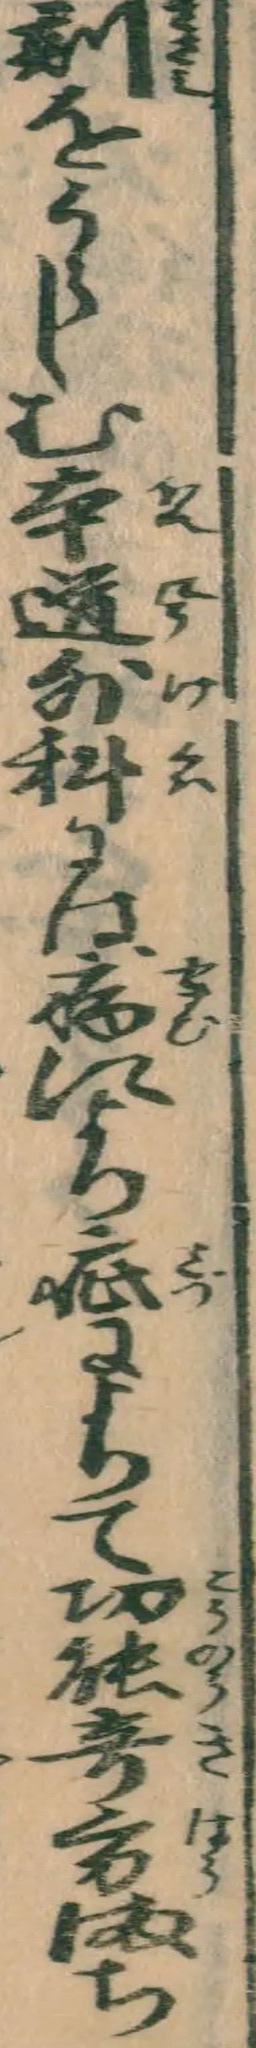刻をうらしむ本道外科には病により疵によりて功能奇方まち
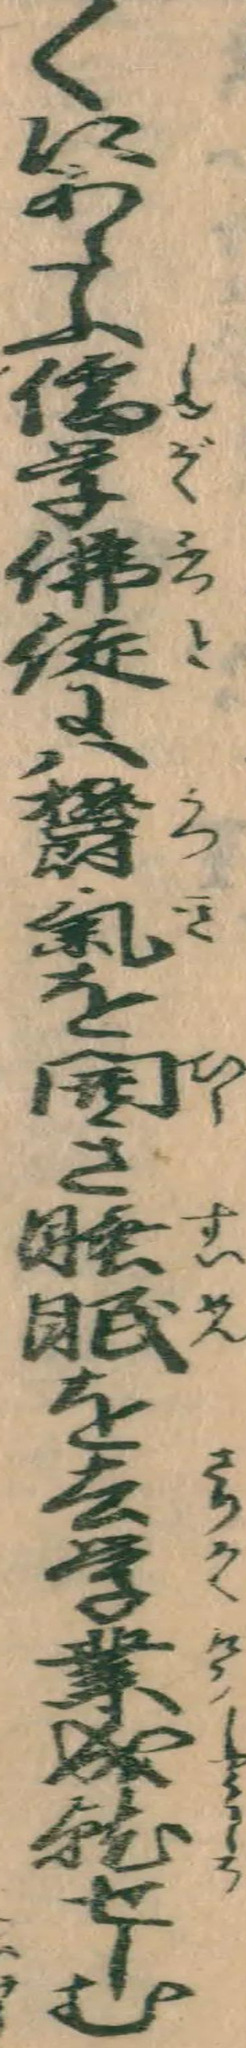〳〵にあたふ儒学仏徒には鬱気を開き睡眠を去学業成就せしむ
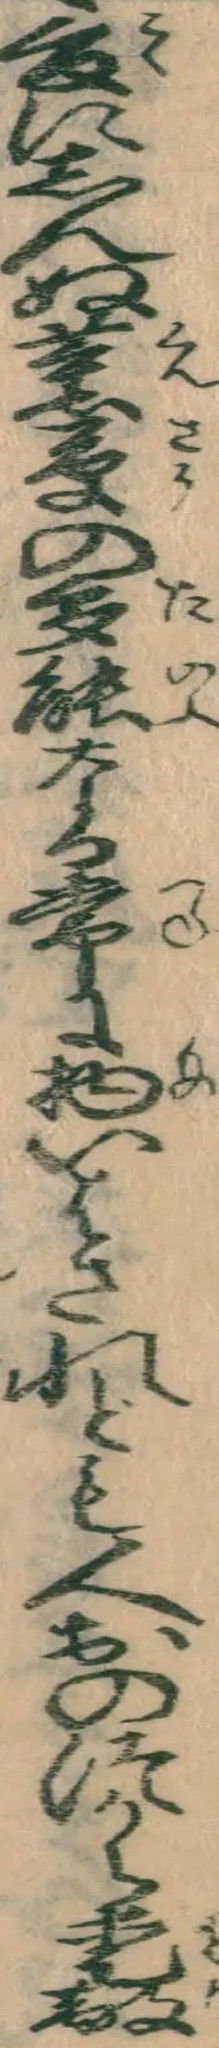爰にしんぬ薫草の多能なる常に物いはされども人おのつから愛敬
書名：煙草記
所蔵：国立国会図書館 National Diet Library, JAPAN
